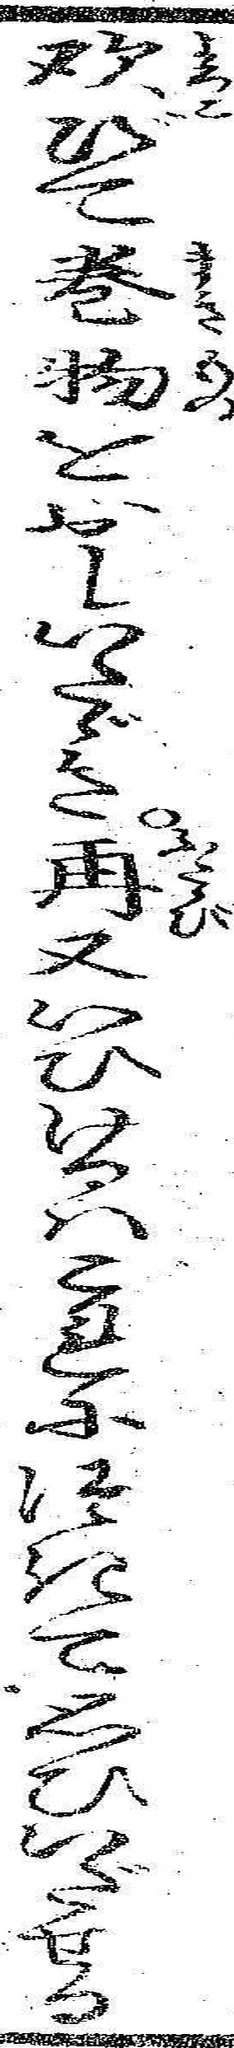歓びて巻物をおしいたゞき。再又いひけるはこれにつきて思ひいだせる
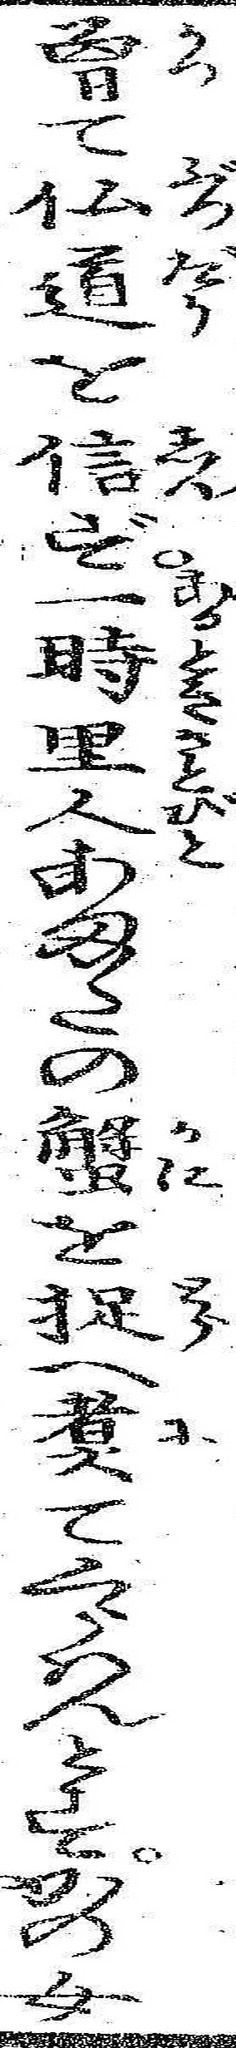曽て仏道を信ず。一時里人あまたの蟹を捉へ煮てくらはんとす。かの女
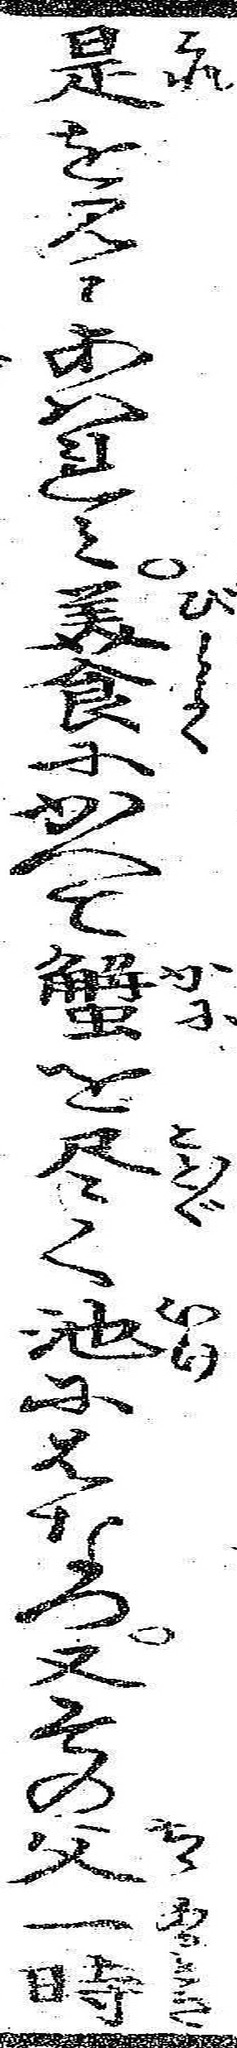是を見てあはれみ。美食にかへて蟹を尽く池にはなつ。又その父一時
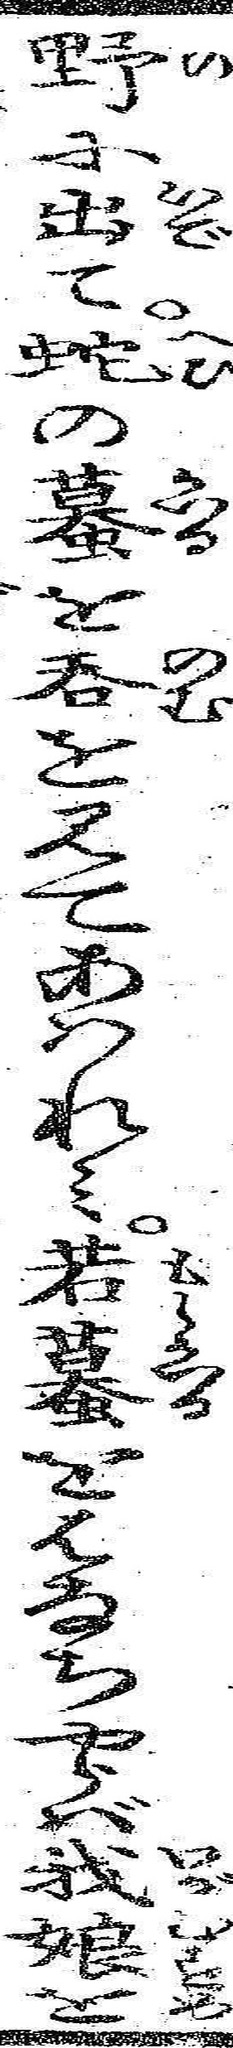野に出て。蛇の蟇を呑を見てあはれみ。若蟇をはなちやらば我娘を
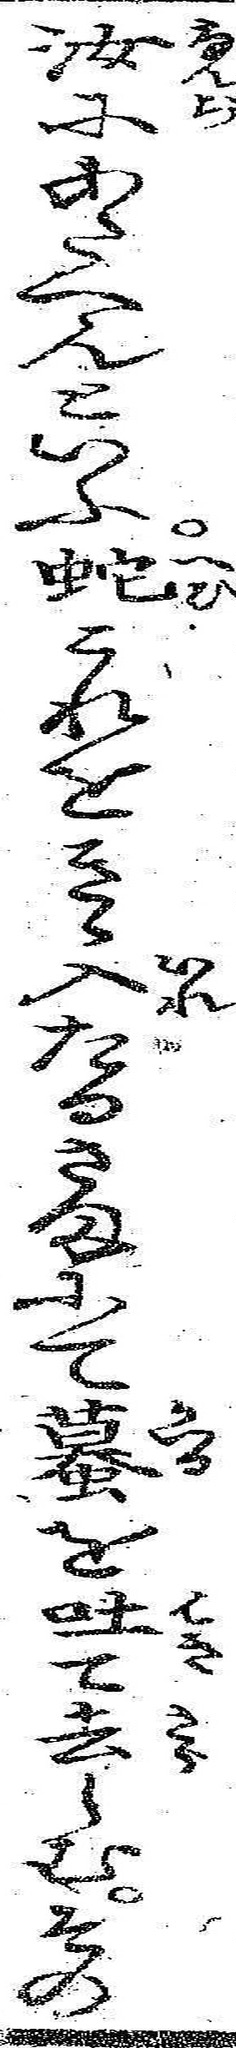汝にあたへんといふ。蛇これをきゝ入たるさまにて蟇を吐て去しむ。その
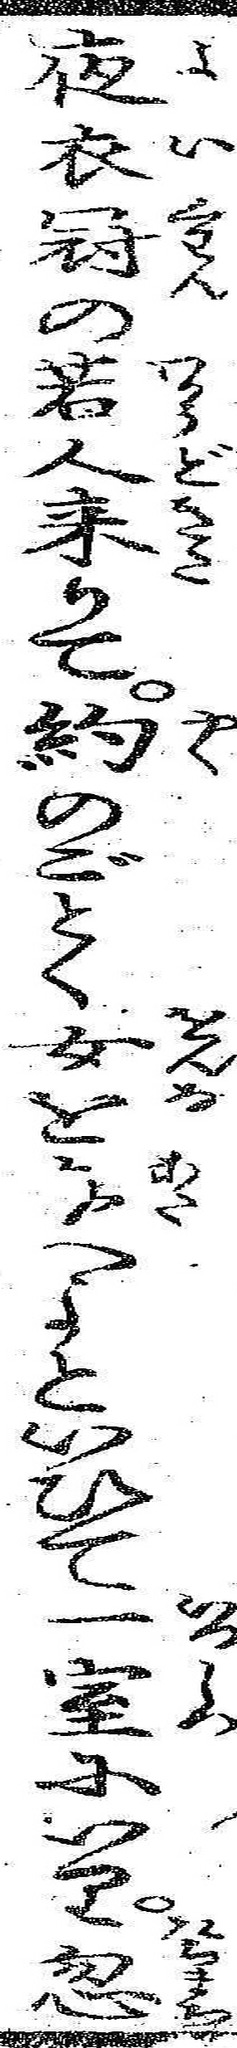夜衣冠の若人来りて。約のごとく女を与へよといひて一室にいり。忽
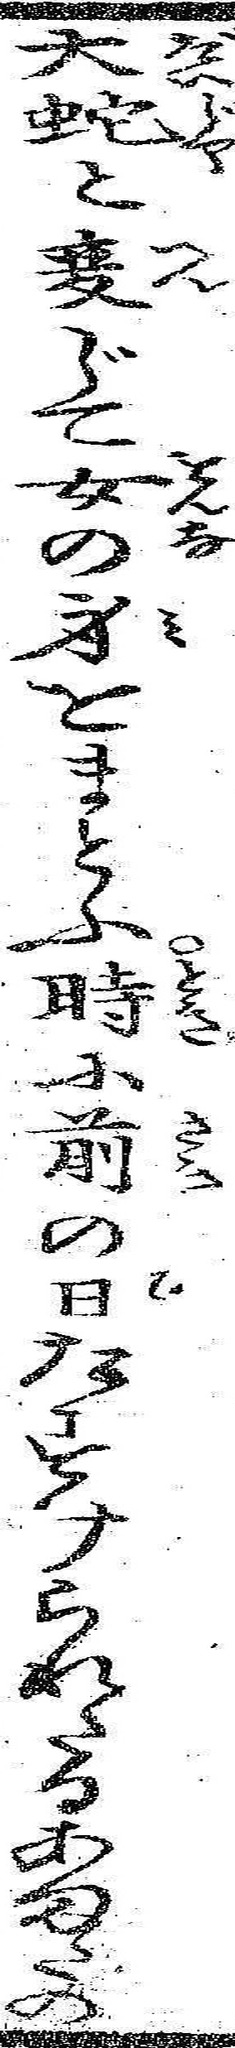大蛇と変じて女の身をまとふ。時に前の日たすけられたるあまたの
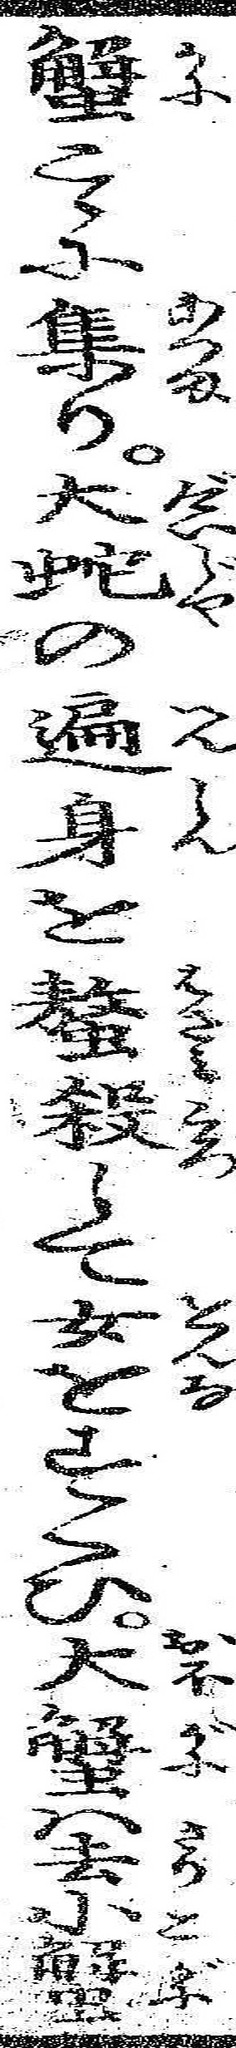蟹こゝに集り。大蛇の遍身を螯殺して女をすくひ。大蟹は去小蟹
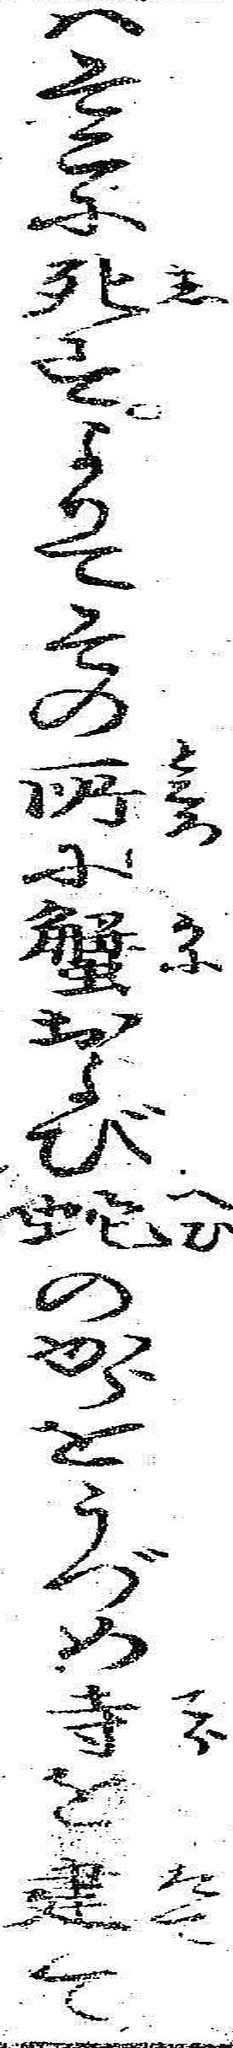はそこに死す。よりてその所に蟹および蛇のからをうづめ寺を建て

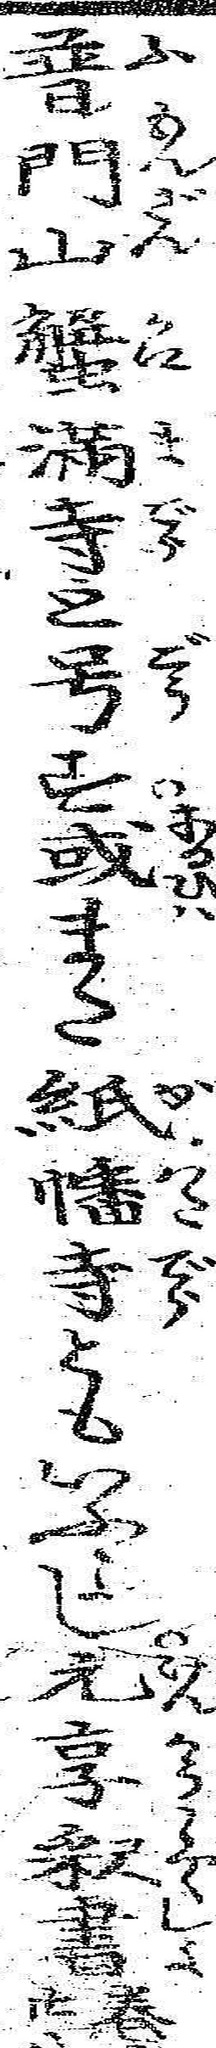普門山蟹満寺と号す。或また紙幡寺ともいふよし。元享釈書巻之廿八
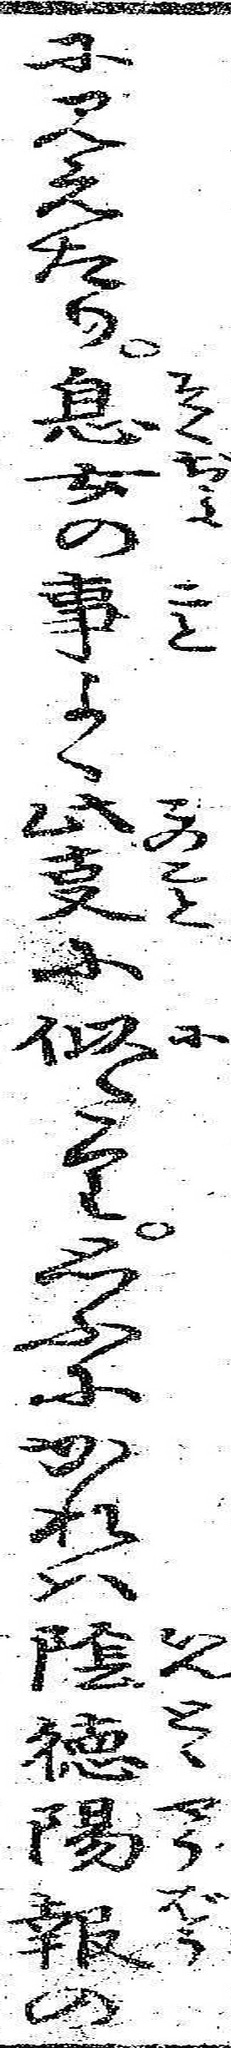に見えたり。息女の事よく此事に似たり。思ふにかれは陰徳陽報の
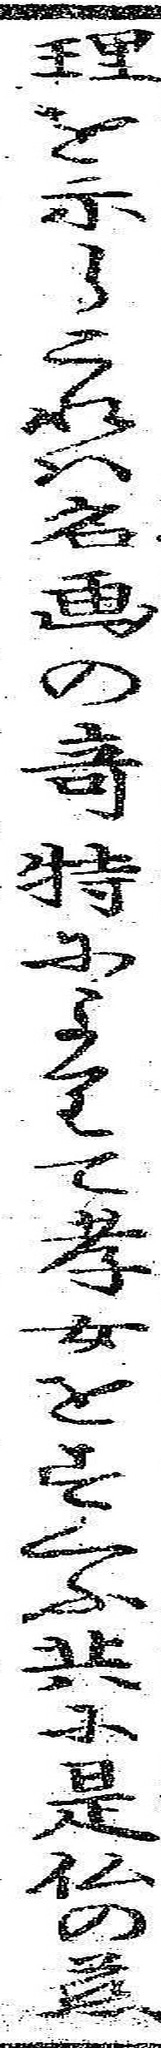理を示しこれは名画の奇特によりて孝女をすくふ。共に是仏の慈
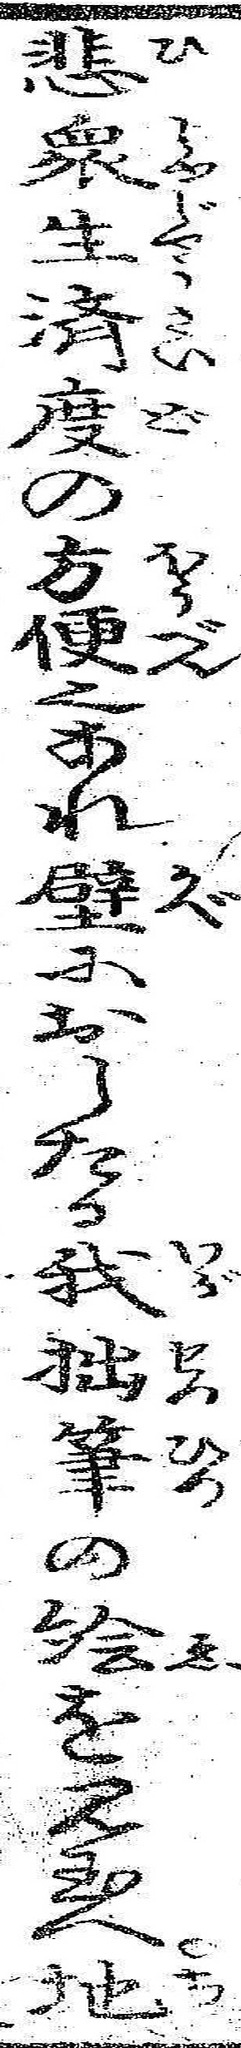悲衆生済度の方便也あれ壁におしたる我拙筆の絵を見玉へ。地
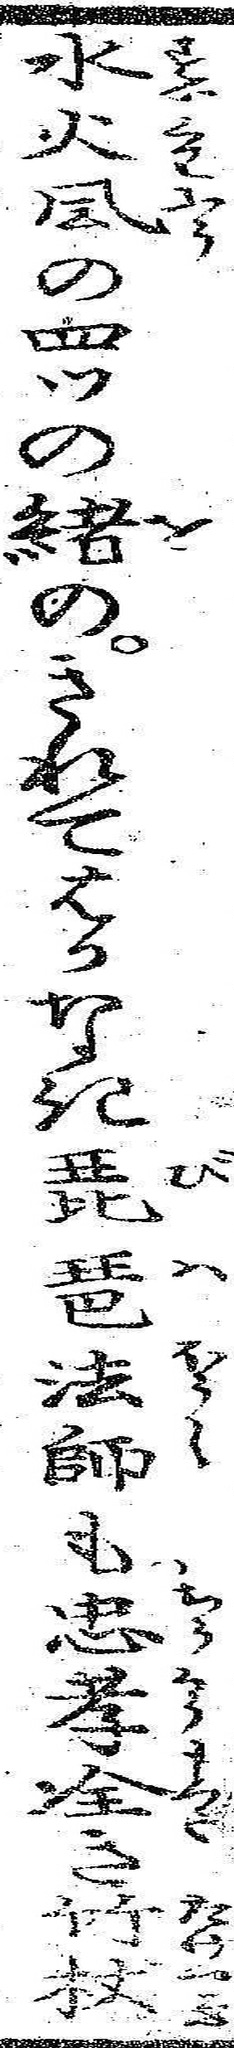水火風の四ツの緒の。きれてはかなき琵琶法師も。忠孝全き竹杖
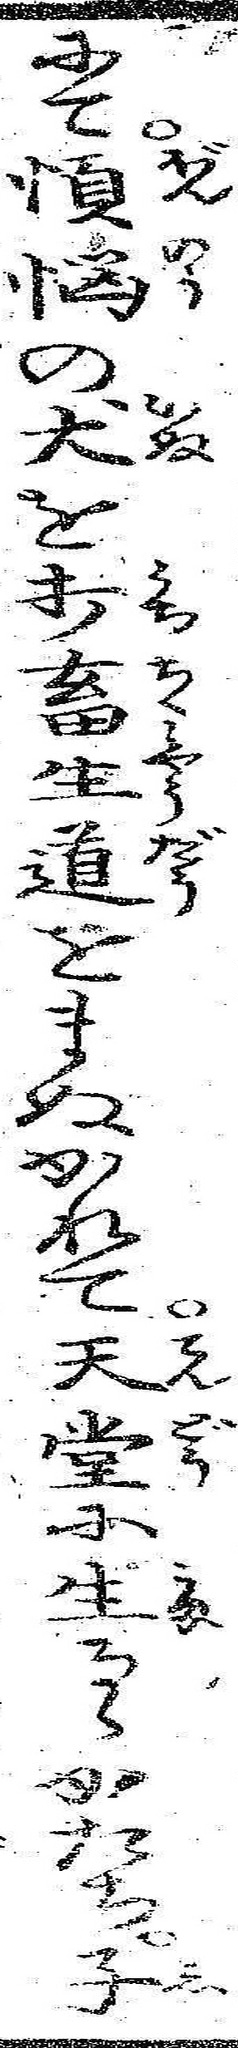にて。煩悩の犬を打畜生道をまぬかれて。天堂に生るゝかたち。子
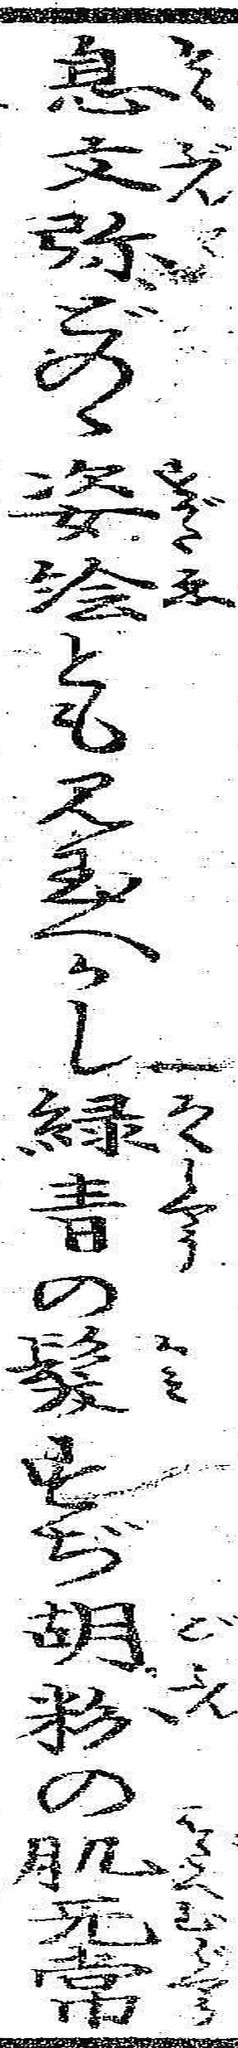息文弥どのゝ姿絵とも見玉へかし。緑青の髪すぢ胡粉の肌無常
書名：昔話稲妻表紙
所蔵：国文学研究資料館
